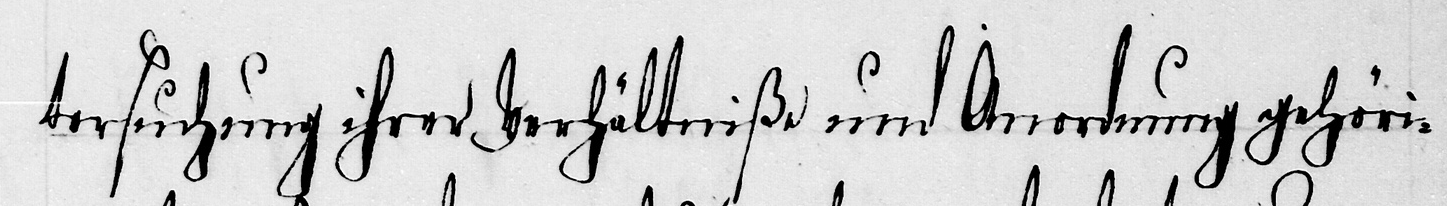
tersuchung ihrer Verhältniße und Anordnung gehöri¬
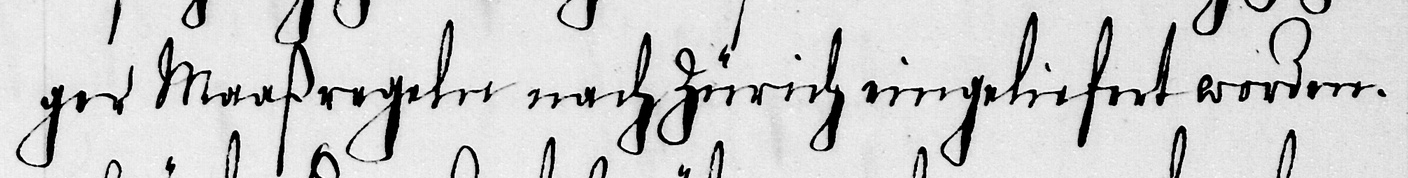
ger Maaßregeln nach Zürich eingeliefert worden.
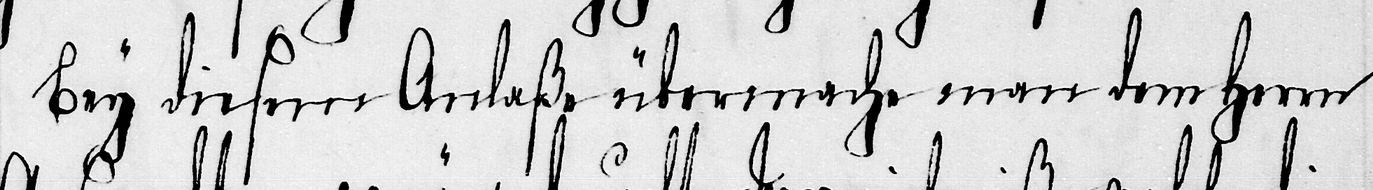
Bey diesem Anlaße übermache man dem Herrn
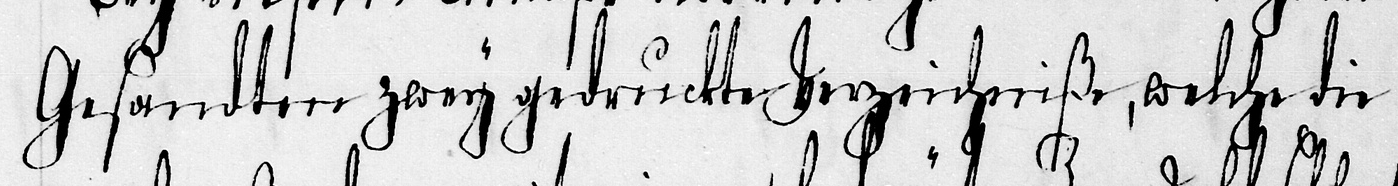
Gesandten zwey gedruckte Verzeichniße, welche die
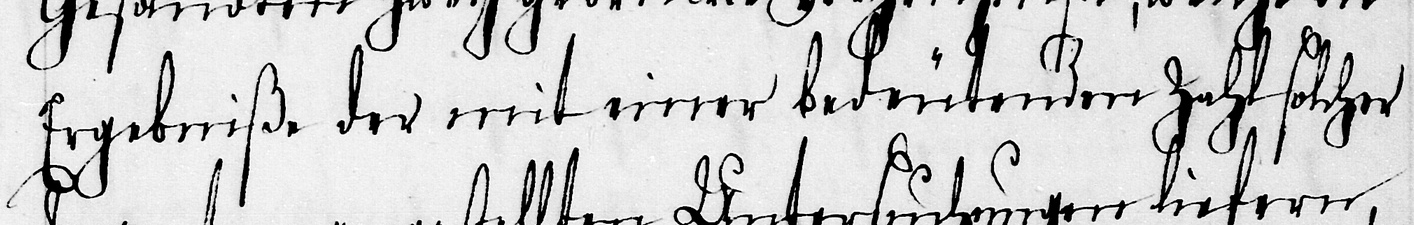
Ergebniße der mit einer bedeutenden Zahl solcher
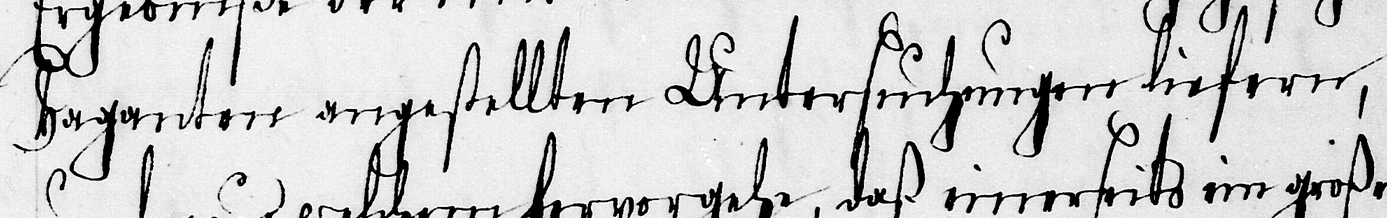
Vaganten angestellten Untersuchungen liefern,
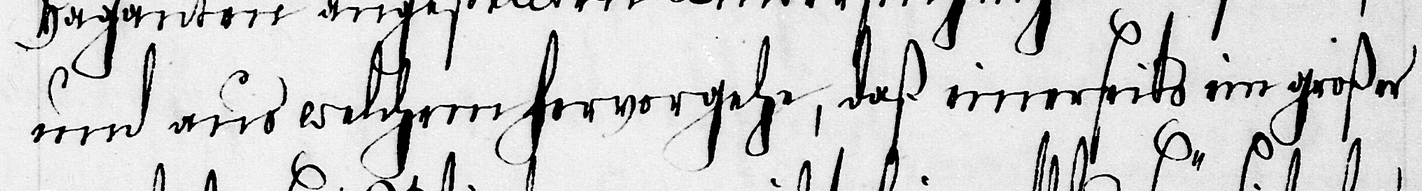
und aus welchem hervorgehe, daß einerseits ein großer
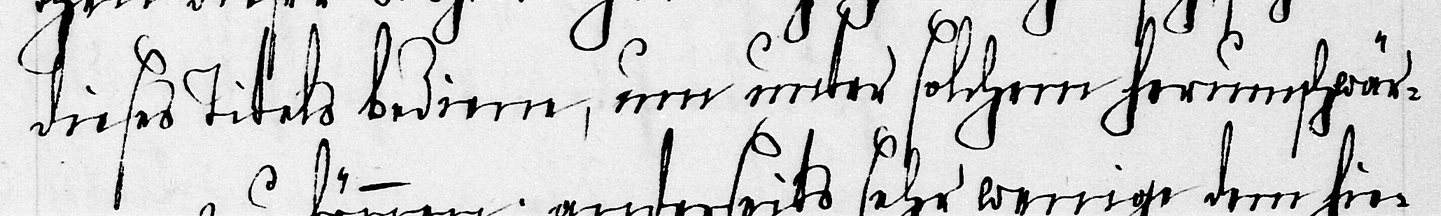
dieses Titels bediene, um unter solchem herumschwär¬
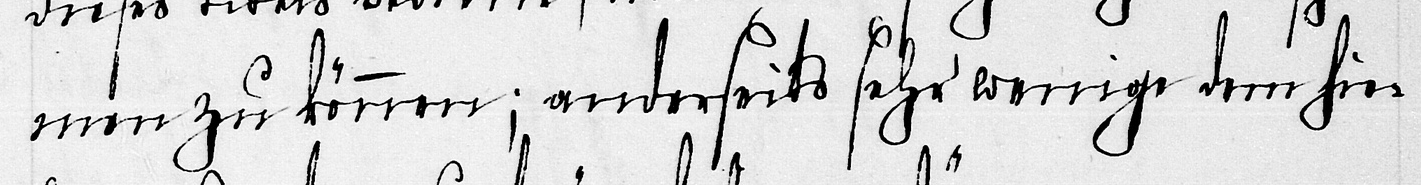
men zu können; anderseits sehr wenige dem hie¬
